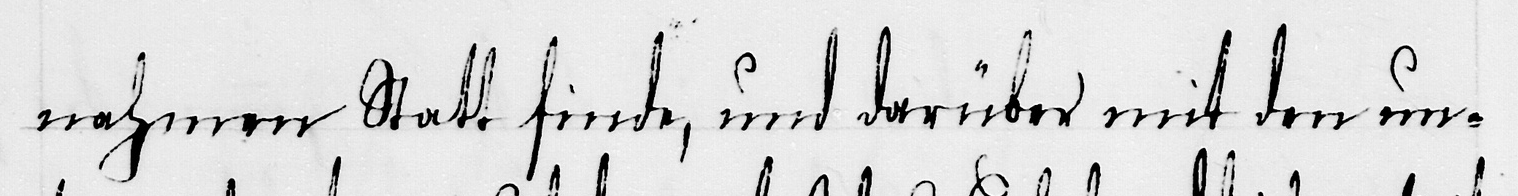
nahmen Statt finde, und darüber mit den un¬
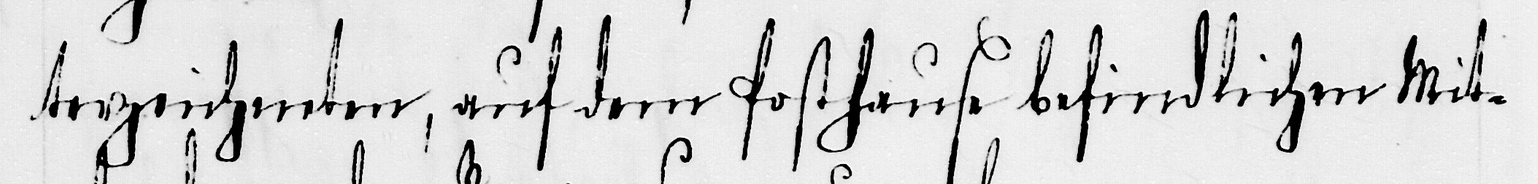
terzeichneten, auf dem Posthause befindlichen Mit¬
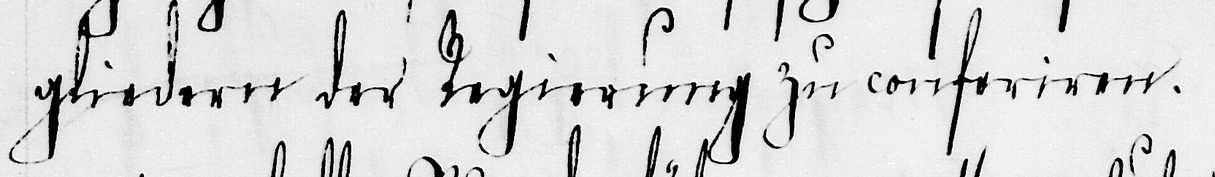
gliedern der Regierung zu conferiren.
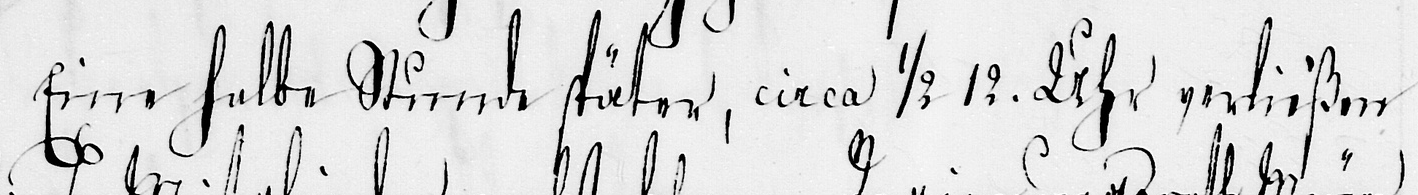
Eine halbe Stunde später, circa ½ 12. Uhr verließen
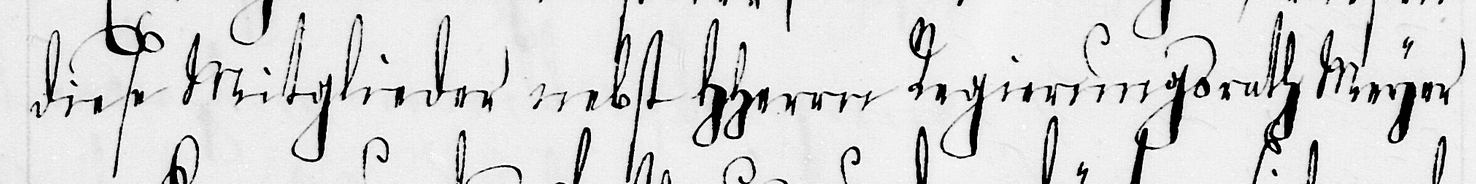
diese Mitglieder nebst HHerrn Regierungsrath Meyer
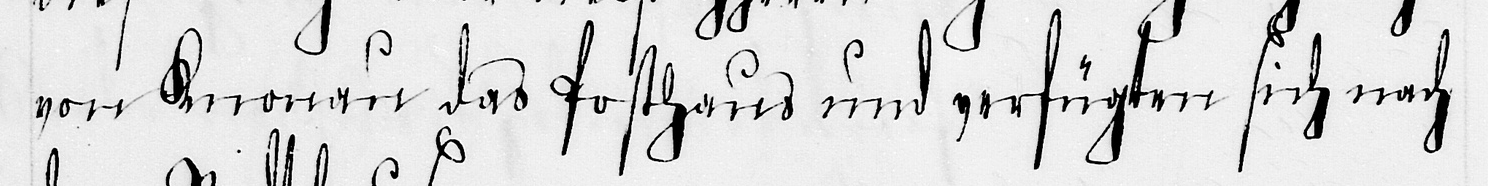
von Knonau das Posthaus und verfügten sich nach
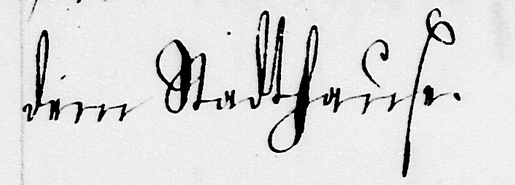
dem Stadthause.
